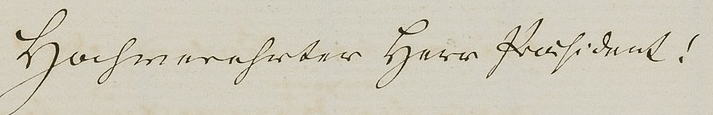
Hochverehrter Herr Präsident!
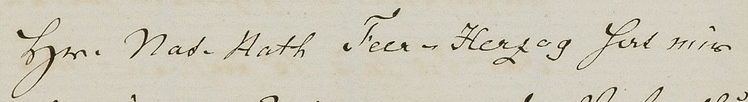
Hr. Nat.Rath Feer-Herzog hat mir
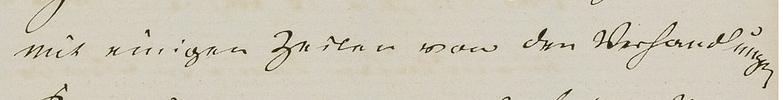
mit einigen Zeilen von den Verhandlungen
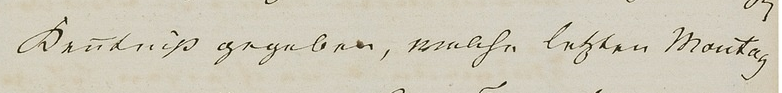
Kenntniß gegeben, welche letzten Montag
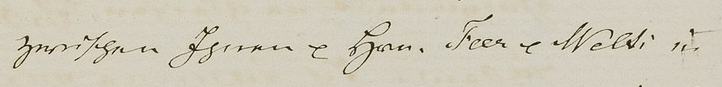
zwischen Ihnen & Hrn. Feer & Welti in
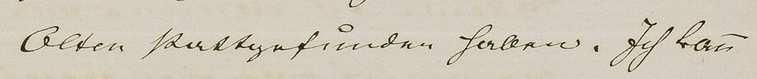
Olten stattgefunden haben. Ich kann
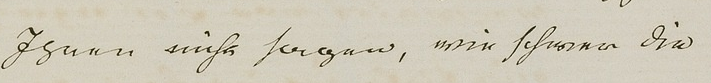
Ihnen nicht sagen, wie schwer die
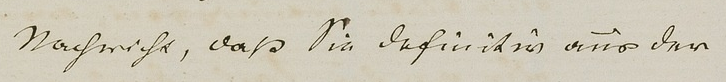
Nachricht, daß Sie definitiv aus der
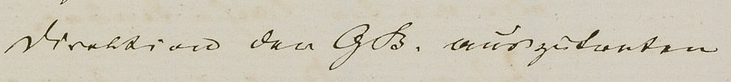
Direktion der GB. auszutreten
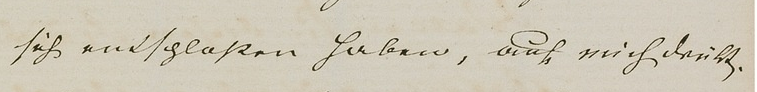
sich entschloßen haben, auf mich drükt.
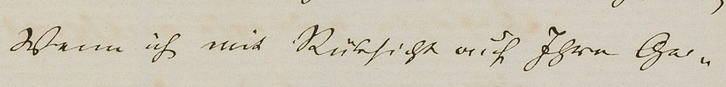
Wenn ich mit Rüksicht auf Ihre Ge-
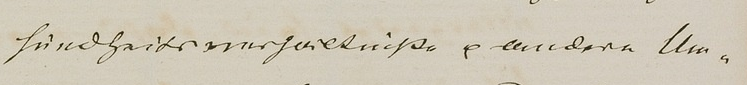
sundheitsverhältniße & andere Um-
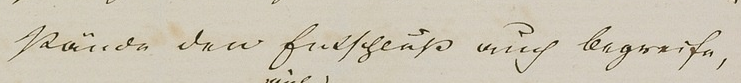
stände den Entschluß auch begreife,
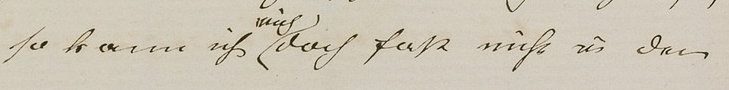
so kann ich mich doch fast nicht in den
